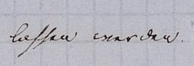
lassen werden.
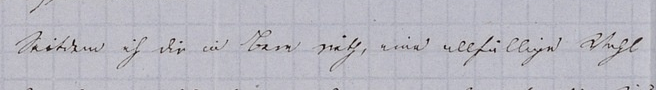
Seitdem ich Dir in Bern rieth, eine allfällige Wahl
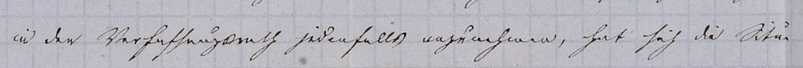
in den Verfassungsrath jedenfalls anzunehmen, hat sich die Situ-
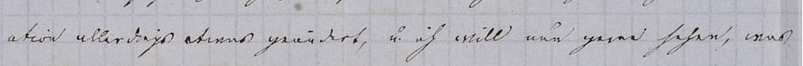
ation allerdings etwas geändert, u. ich will nun gerne sehen, was
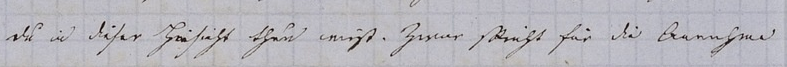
Du in dieser Hinsicht thun wirst. Zwar spricht für die Annahme
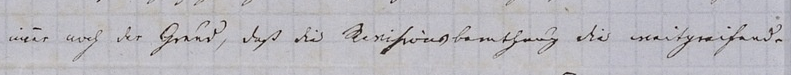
immer noch der Grund, daß die Revisionsberathung die weitgreifend-
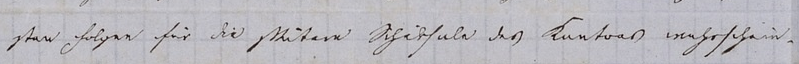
sten Folgen für die spätern Schiksale des Kantons wahrschein-
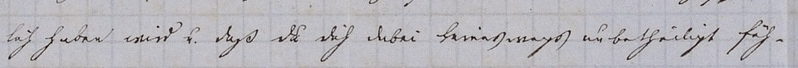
lich haben wird u. daß Du Dich dabei keineswegs unbetheiligt füh-
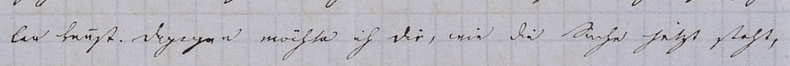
len kannst. Dagegen möchte ich Dir, wie die Sache jetzt steht,
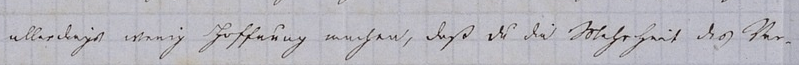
allerdings wenig Hoffnung machen, daß Du die Mehrheit des Ver-
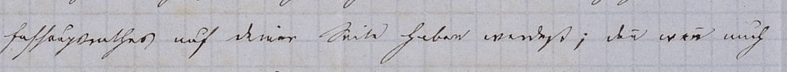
fassungsrathes auf Deiner Seite haben werdest; denn wenn auch
